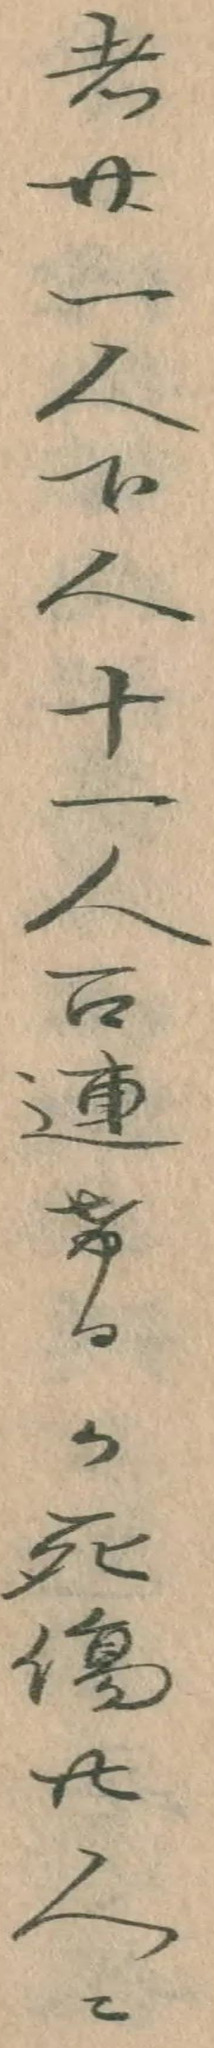者共一人下人十一人召連希るか死傷廿人に
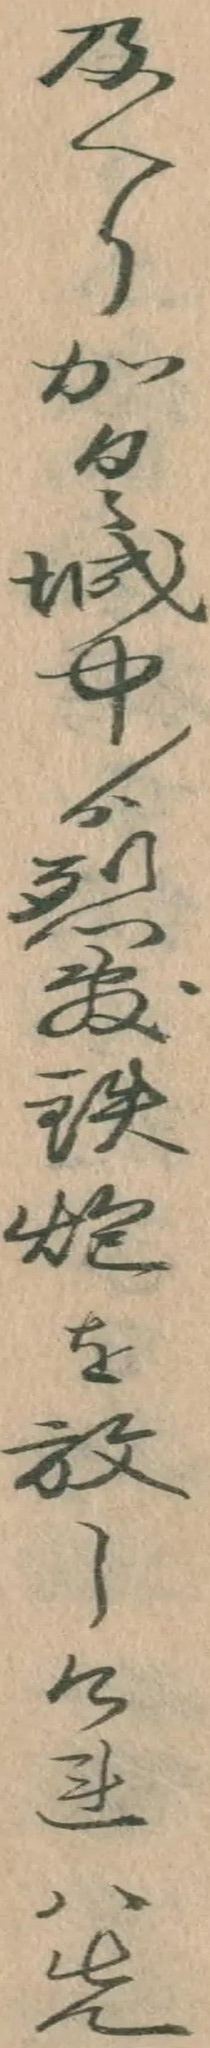及へり加具城中ゟ烈敷鉄炮を放しけ連は先
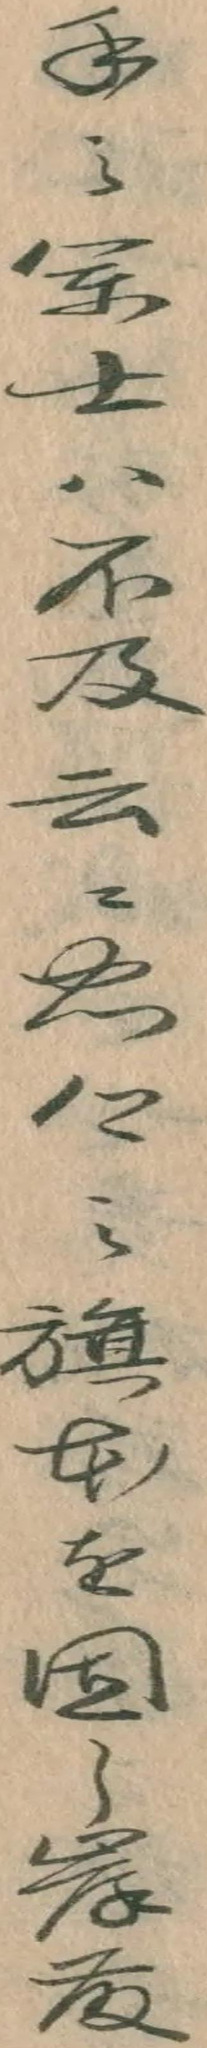手之軍士は不及云に忠郷之旗本を固し岸藤
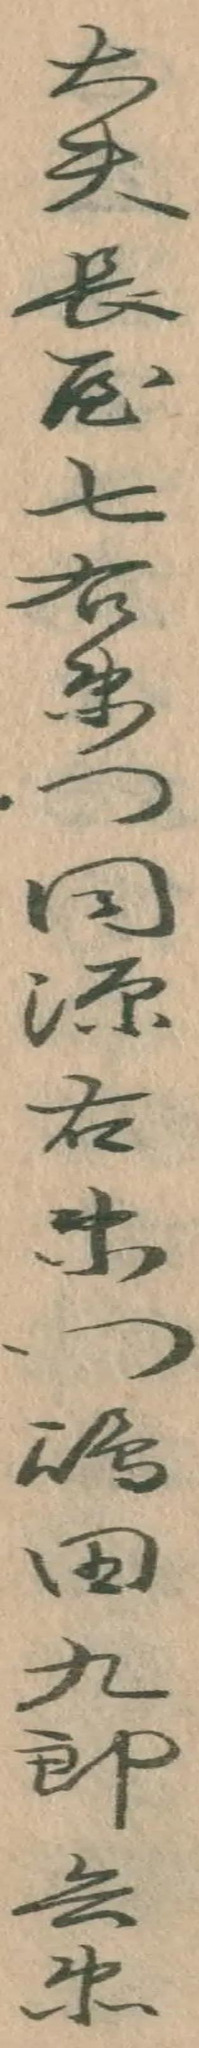太夫長屋七右衛門同源右衛門島田九郎兵衛
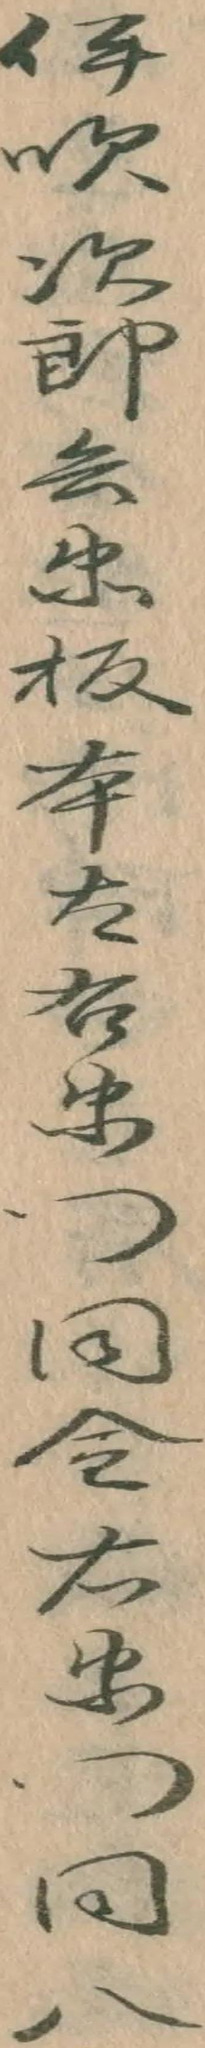伊吹次郎兵衛板夲太右衛門同金右衛門同八
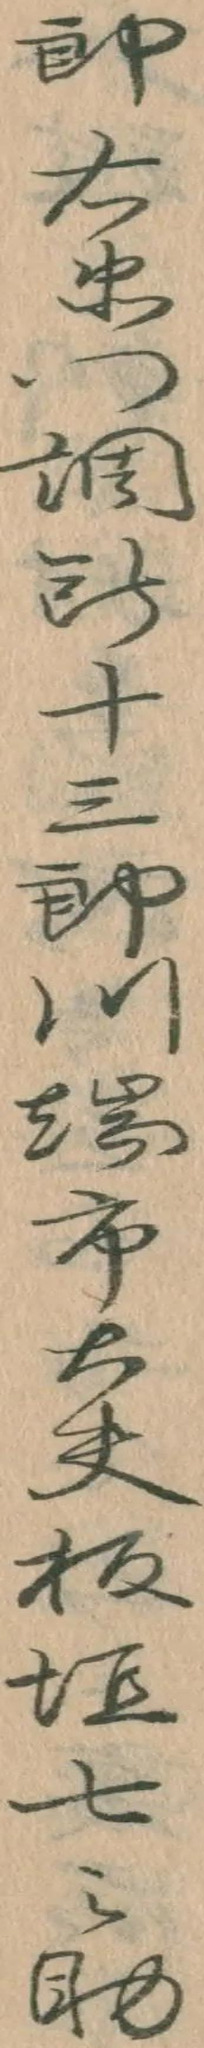樓右衛門調所十三郎川端市太夫板垣七之助
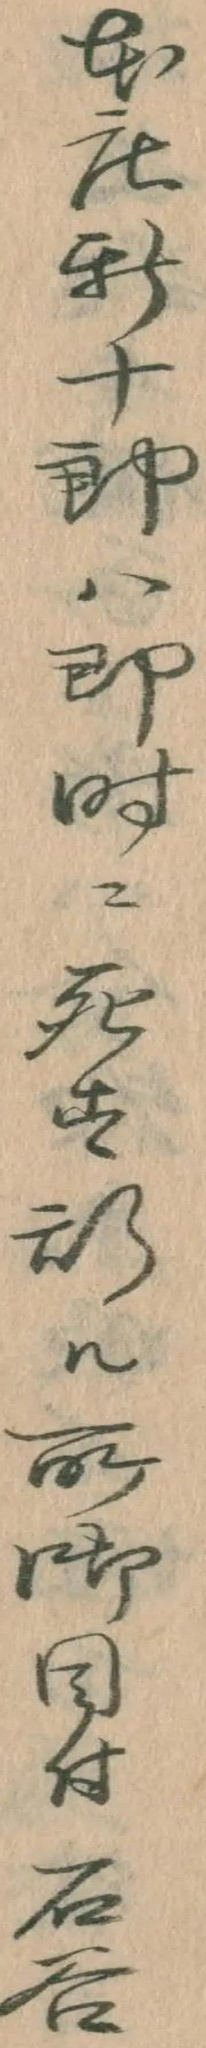本庄新十郎は即時に死春斯る所御目付石谷
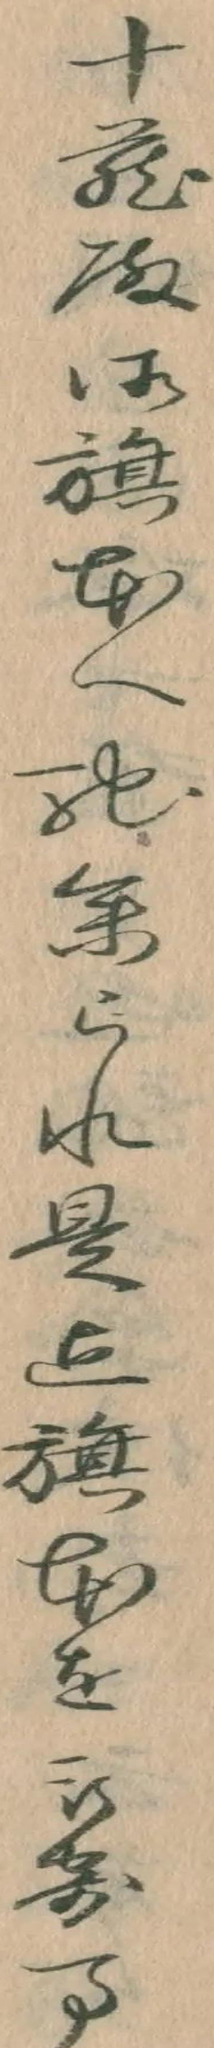十蔵殿御旗本へ馳参られ是迄旗本を被寄事
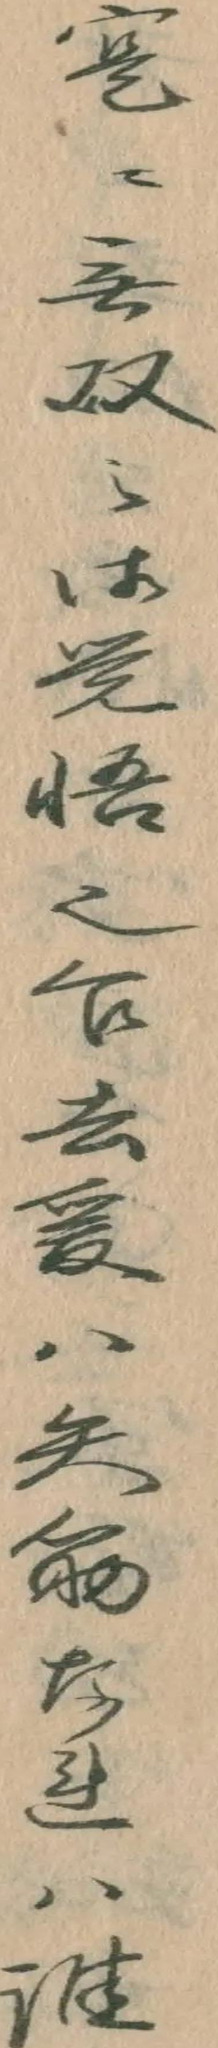寔に無双之御覚悟也乍去爰は矢筋な連は誰
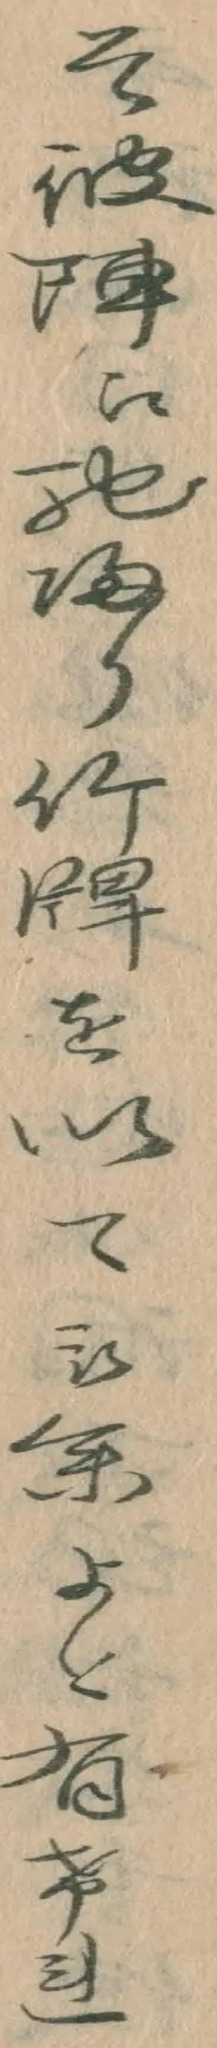そ彼陣江馳帰り竹牌を以て被参よと有希連
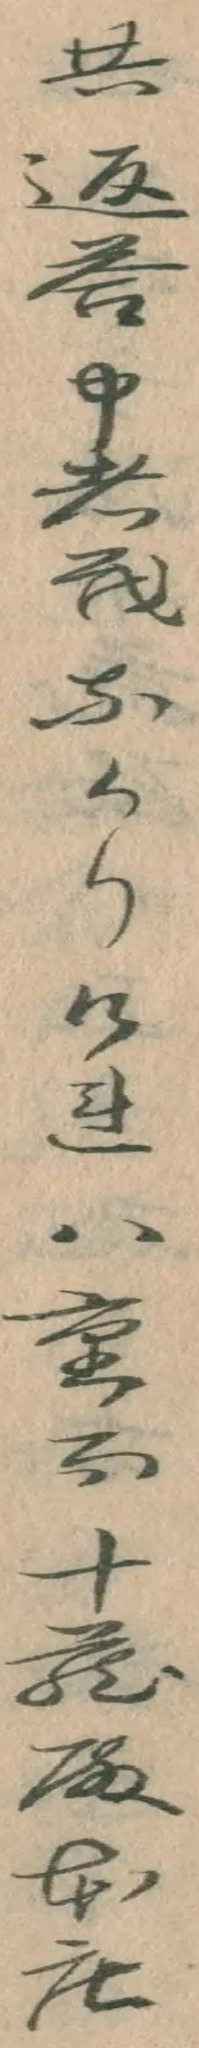共返答申者茂なかりけ連は重而十蔵殿本庄
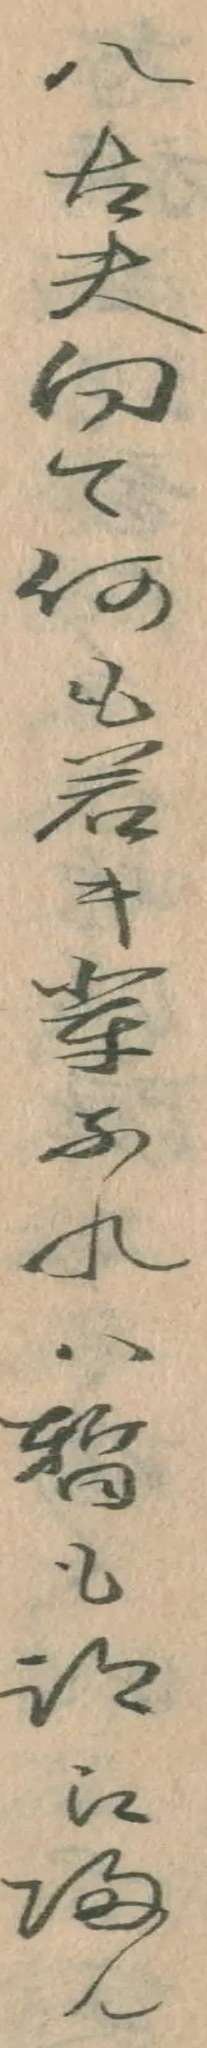八太夫向て何も若き輩なれは暫も跡江帰ん
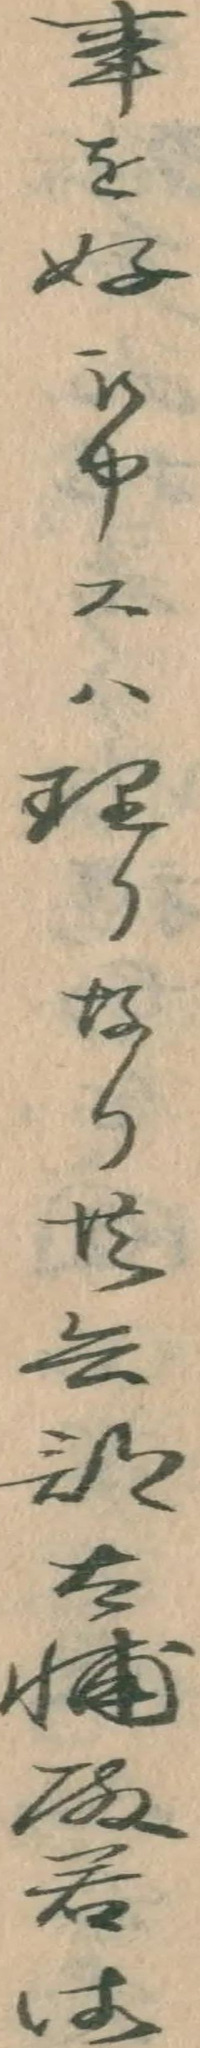事を好被申すは理りなり共兵部太輔殿若御
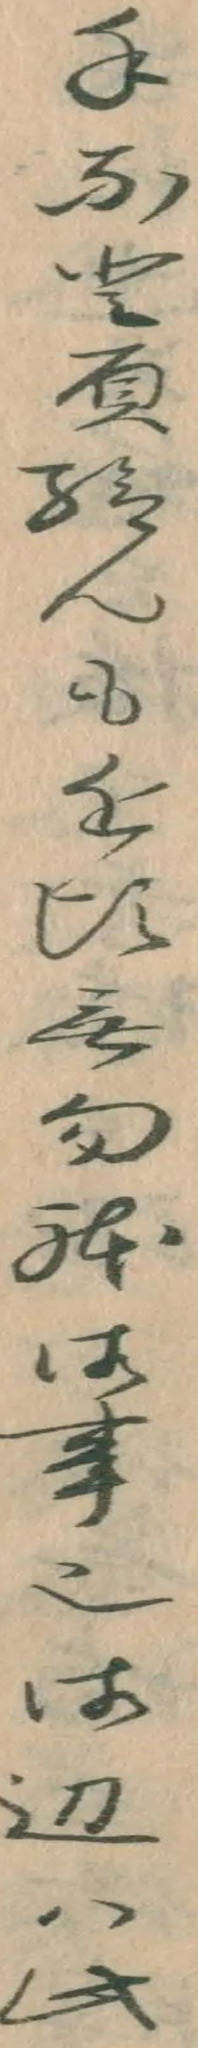手な登負給んも近頃無句躰御事也御返は此
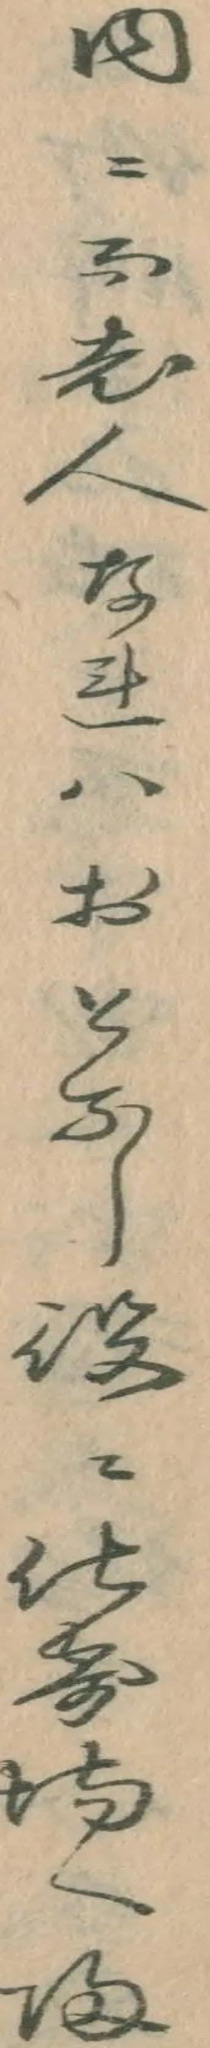内に而老人な連はおとなし役に仕寄場へ帰

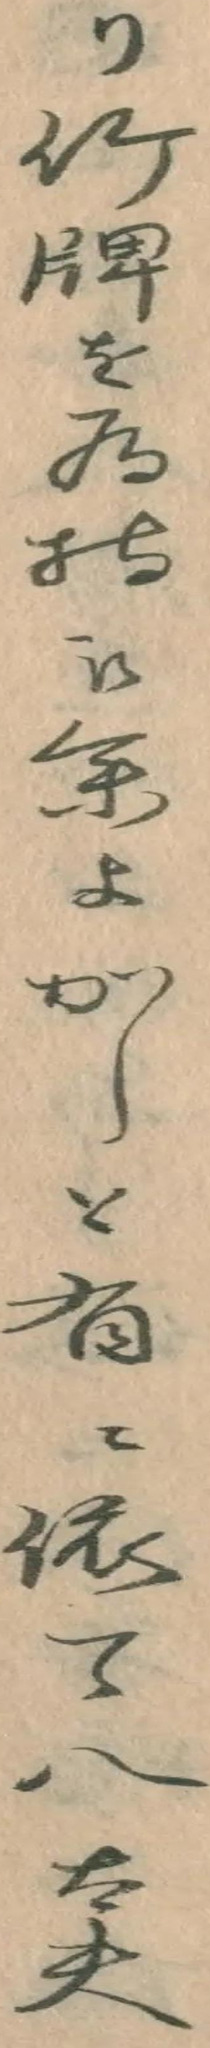り竹牌を為持被参よかしと有に依て八太夫
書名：切支丹御退治記 49巻. [5]
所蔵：国立国会図書館 National Diet Library, JAPAN
